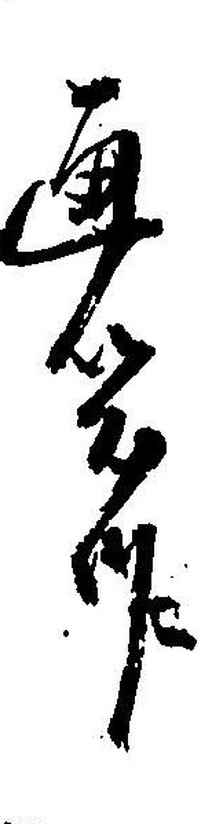通笑作
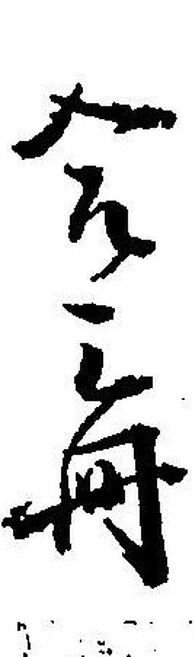合三冊
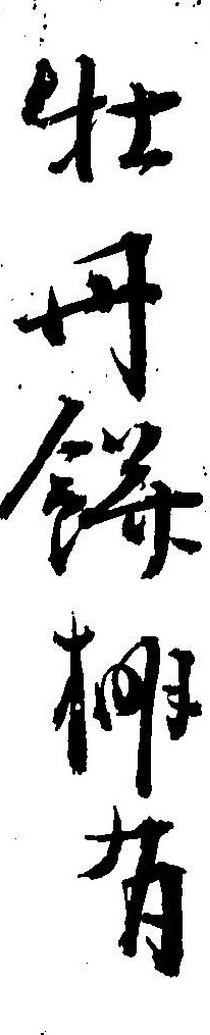牡丹餅棚有
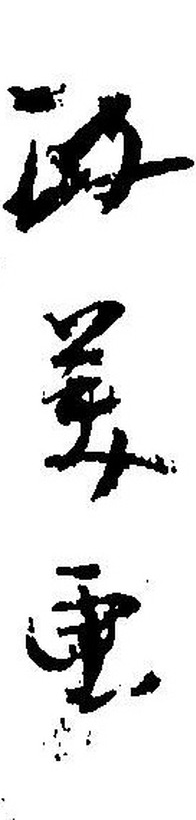政美画

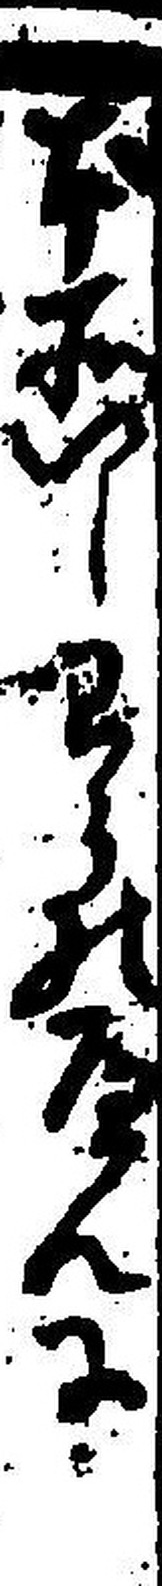本所いしわらのへんに
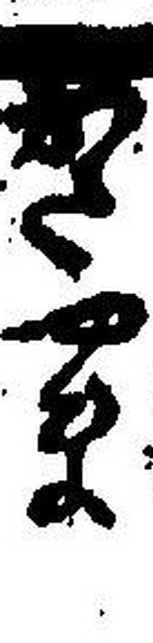かたやま
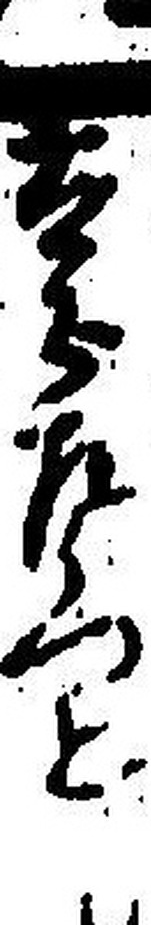太郎左衛門と
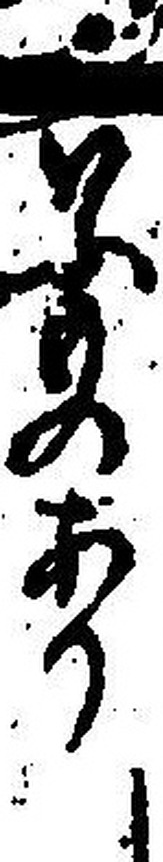いふものあり
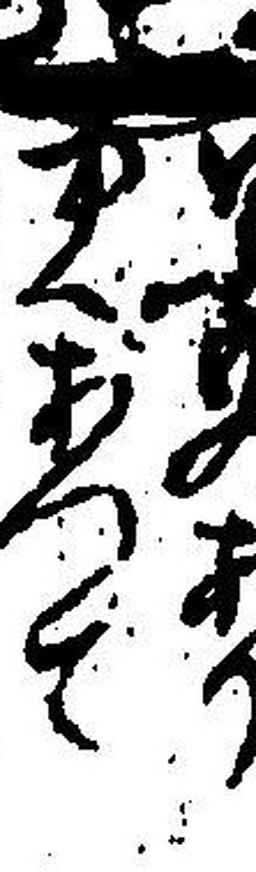ゆへあつて
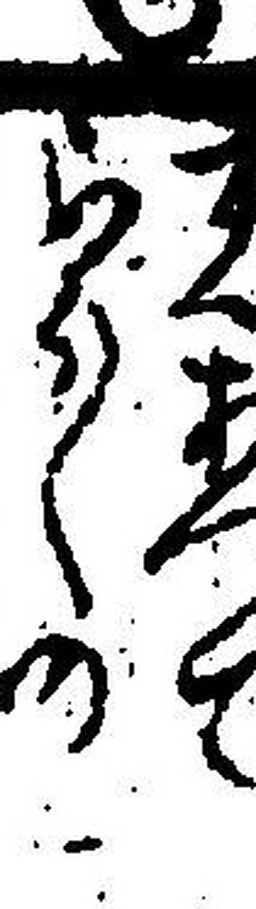らう〳〵の
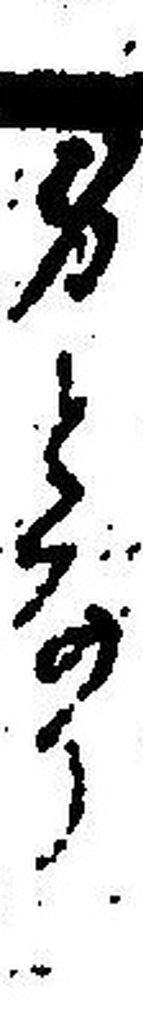身となり
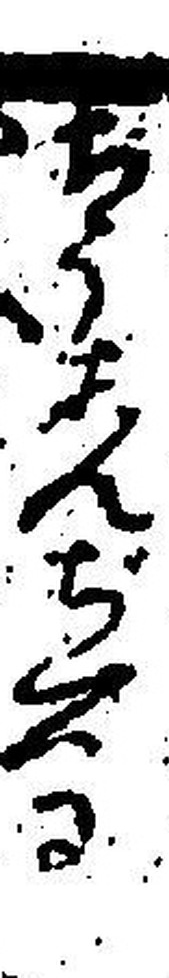ちうしんぢくんに
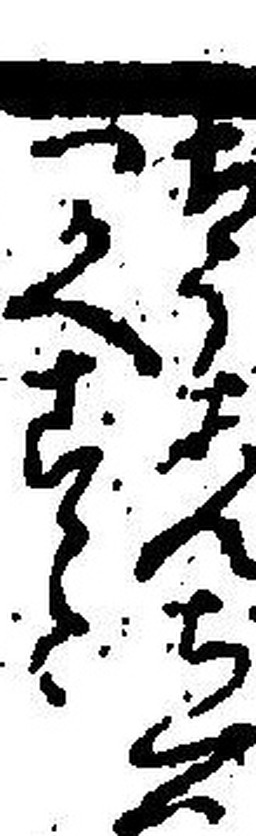つかへすと
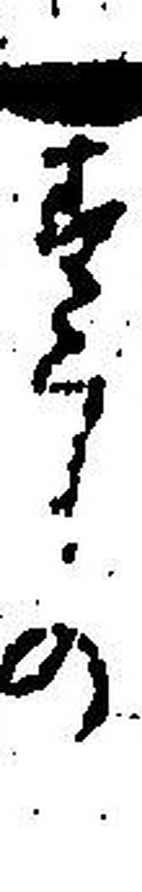すこしの
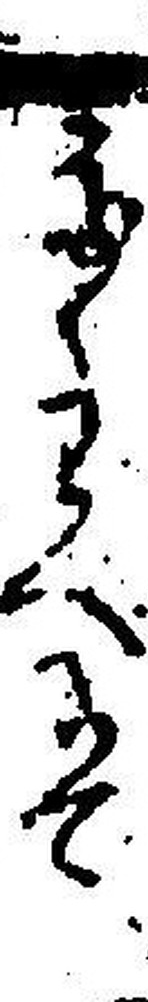たくわへにて
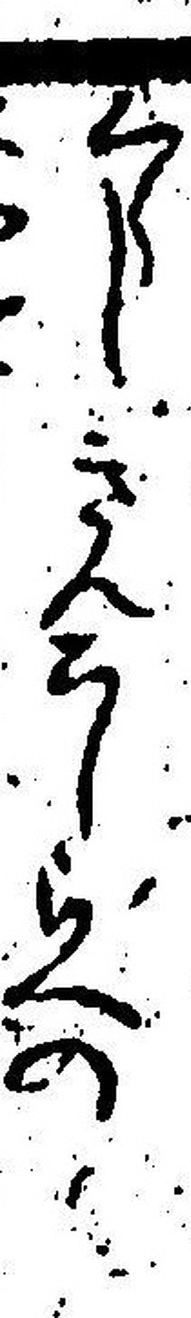くらしきんこしらへの
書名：牡丹餅棚有 / 市場通笑作
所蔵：東京大学総合図書館 General Library in the University of Tokyo, JAPAN
